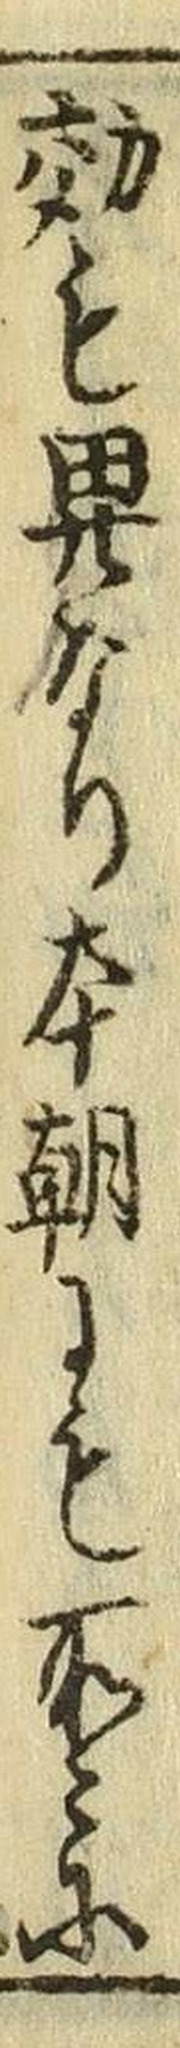効も異なり本朝にも所々に
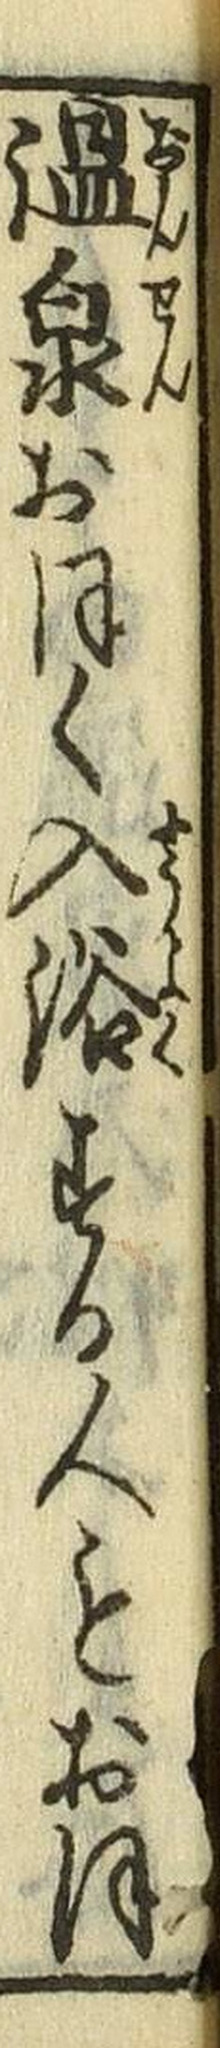温泉おほく入浴する人もおほ
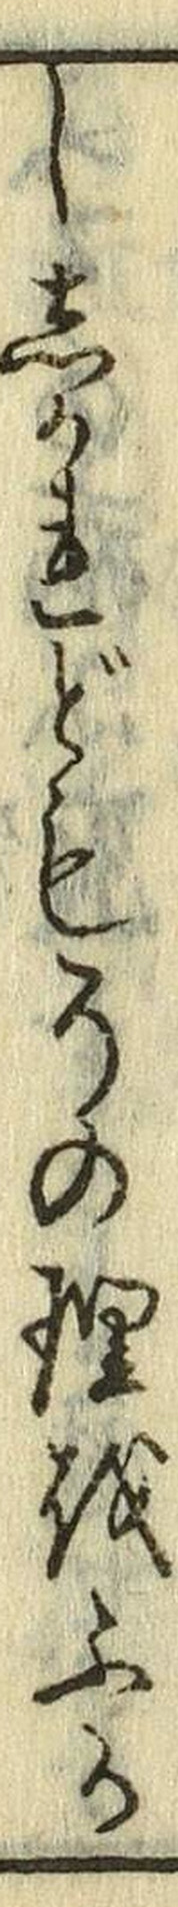ししかれどもその理をふか
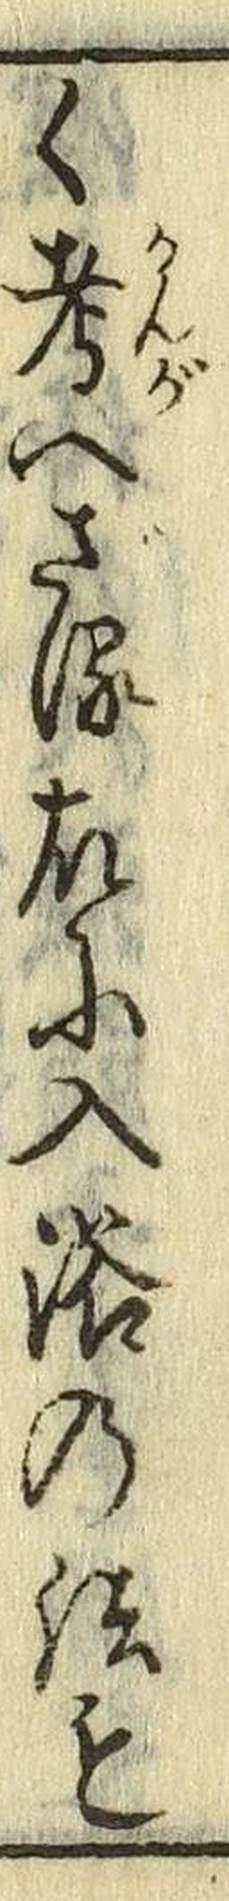く考へざる故に入浴の法も
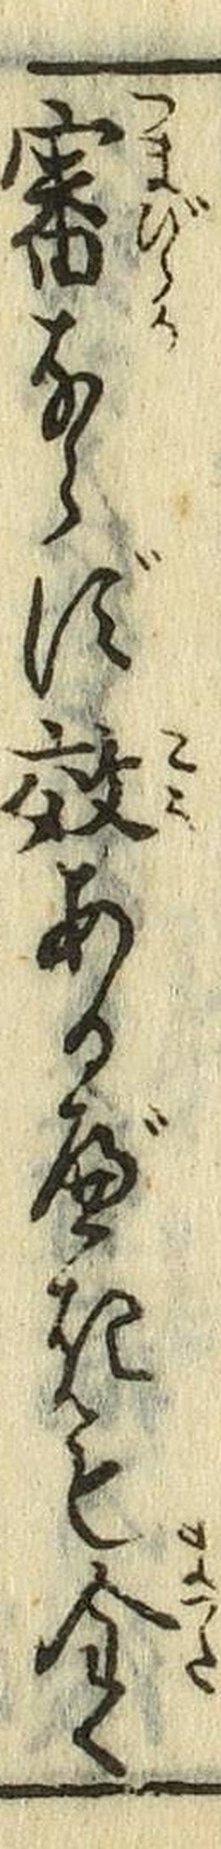審ならず効あるべきも全く
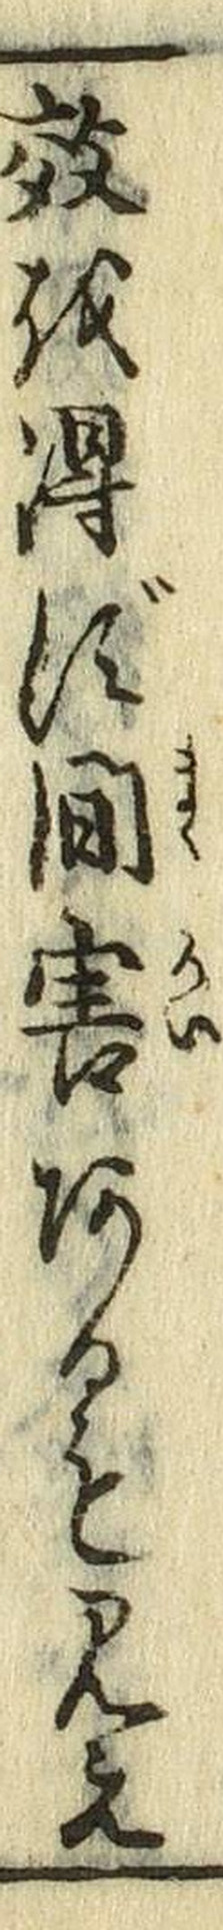効を得ず間害あるも見え
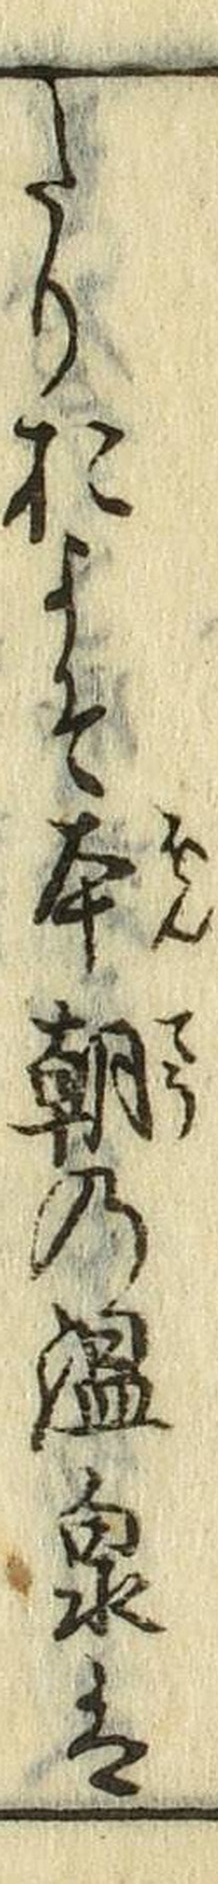たりおよそ本朝の温泉は
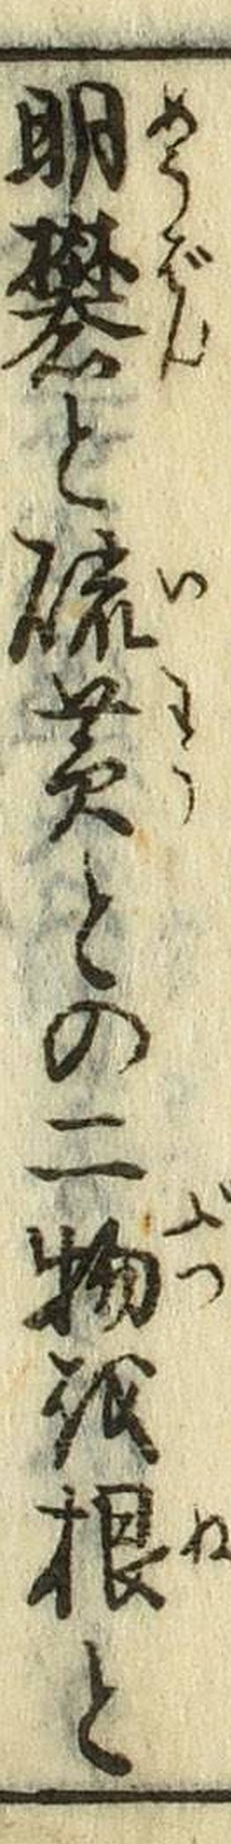明礬と硫黄との二物を根と
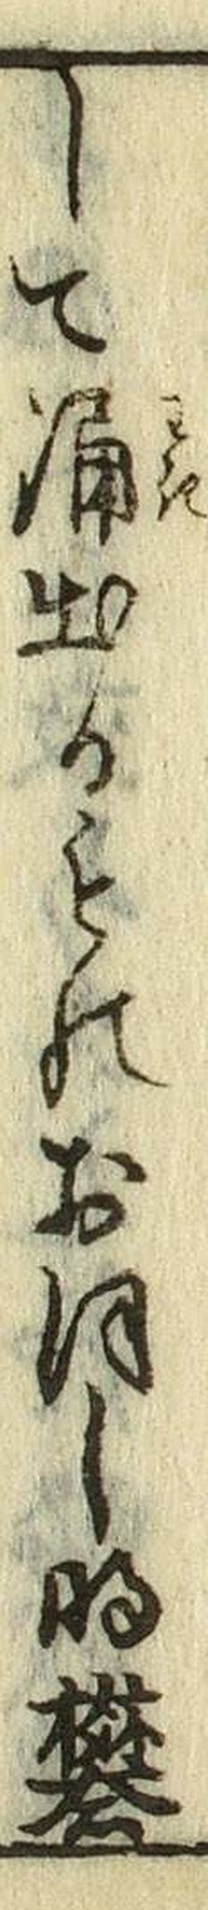して涌出るものおほし明礬
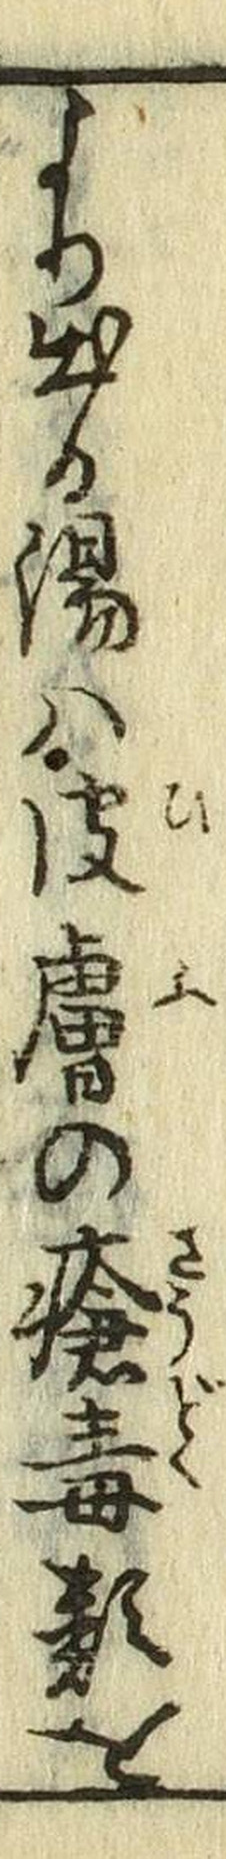より出る湯は皮膚の瘡毒類を
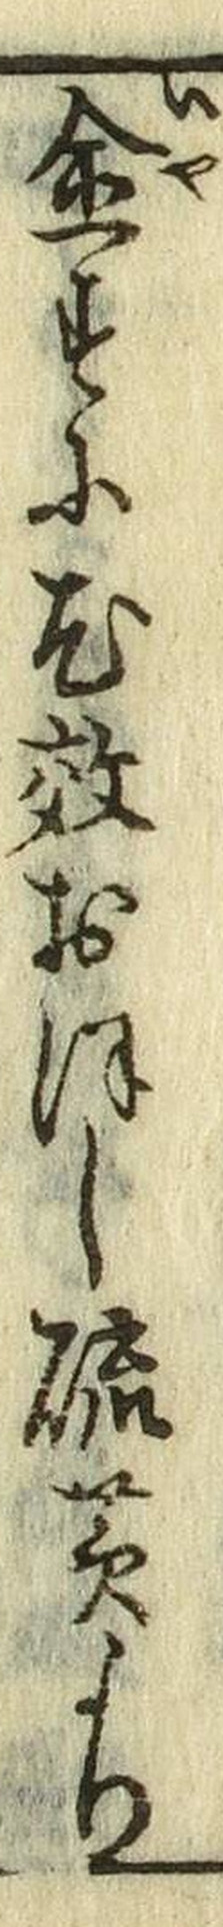愈すに尤効おほし硫黄より
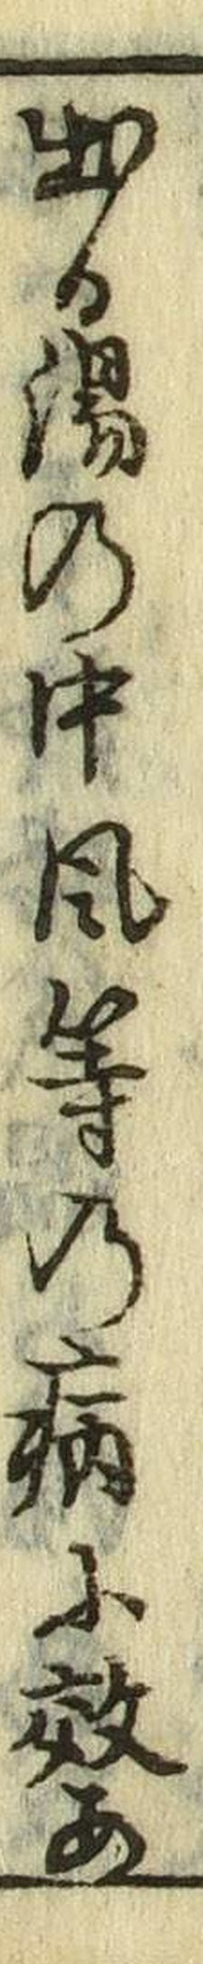出る湯の中風等の病に効あ

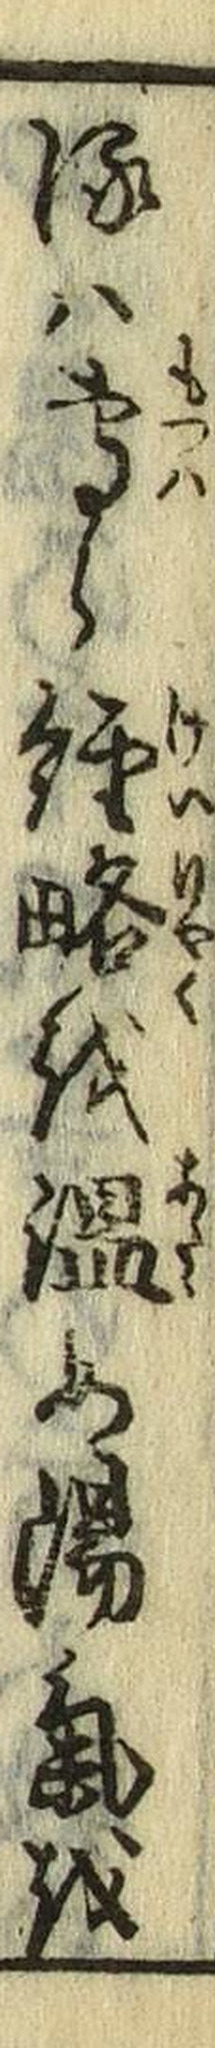るは専ら経略を温め湯気を
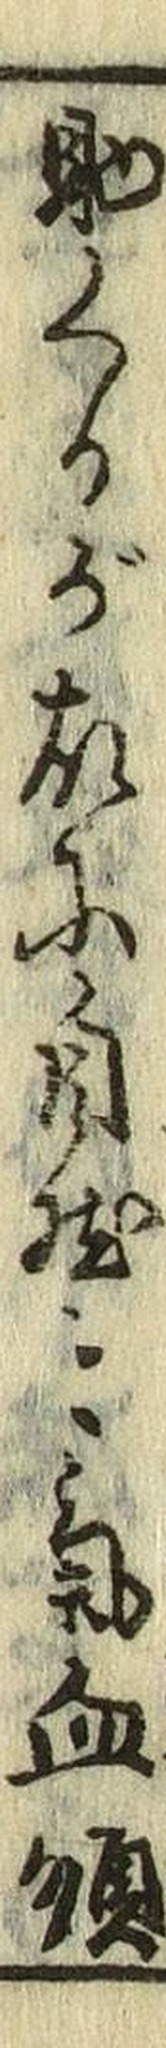助くるが故に自然と気血順
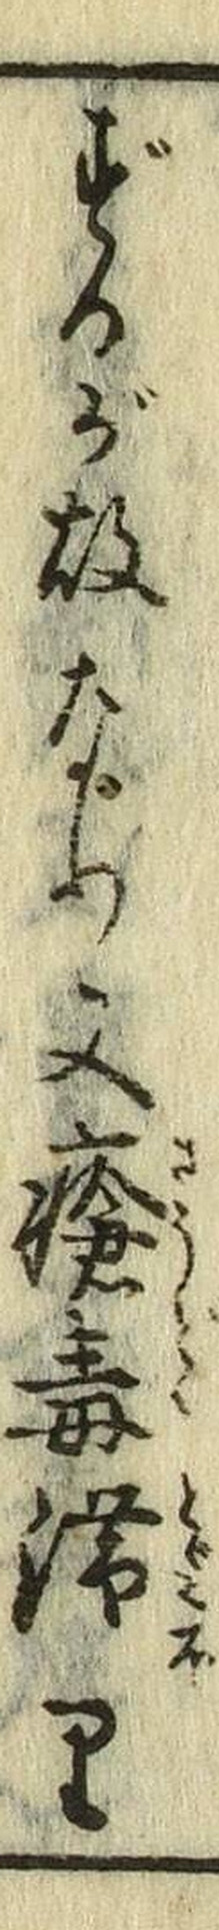ずるが故なり又瘡毒滞り
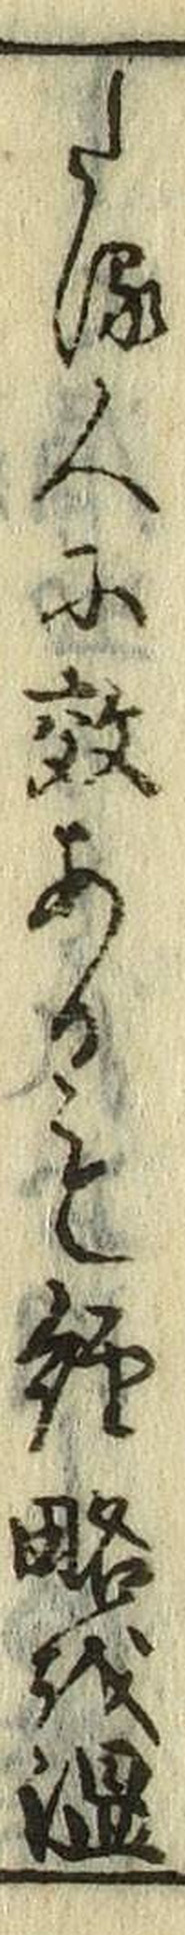たる人に効あるも経略を湿
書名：居家養生記
